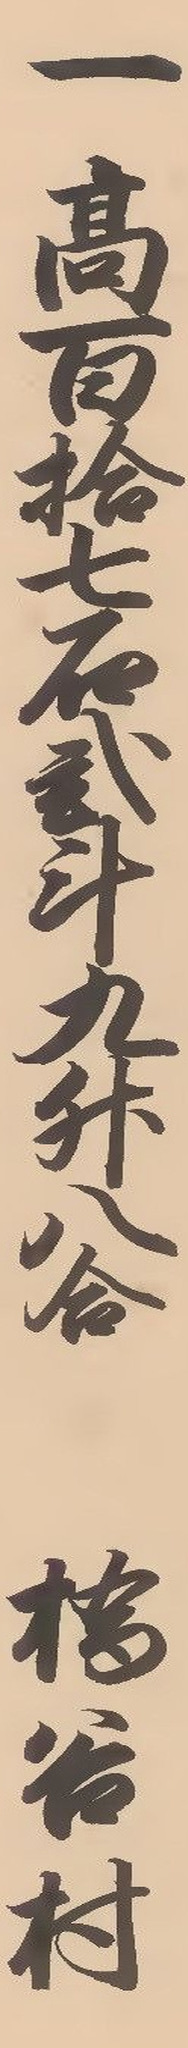一高百拾七石弐斗九升八合橋谷村
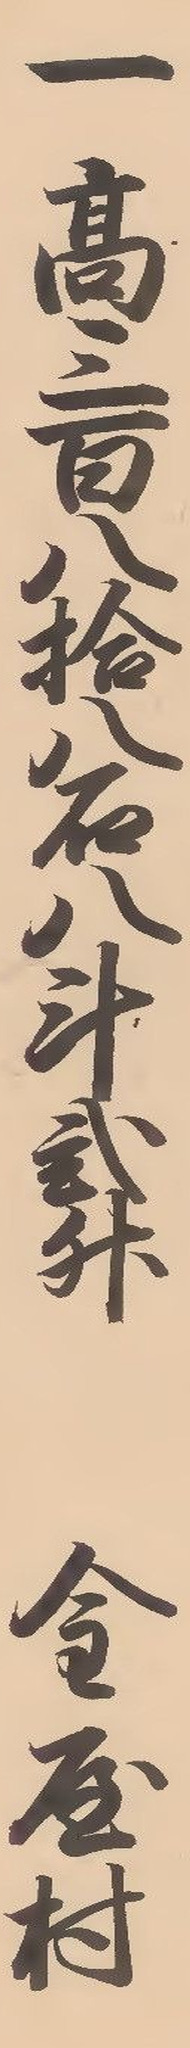一高三百八拾八石八斗弐升金屋村
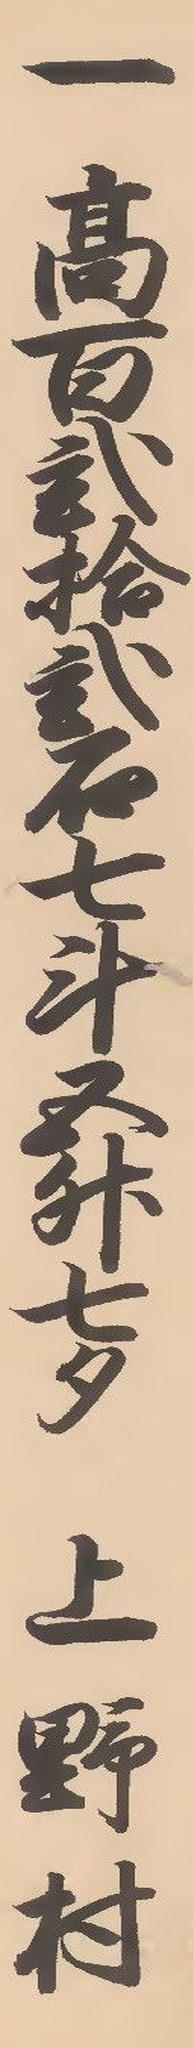一高百弐拾弐石七斗五升七勺上野村
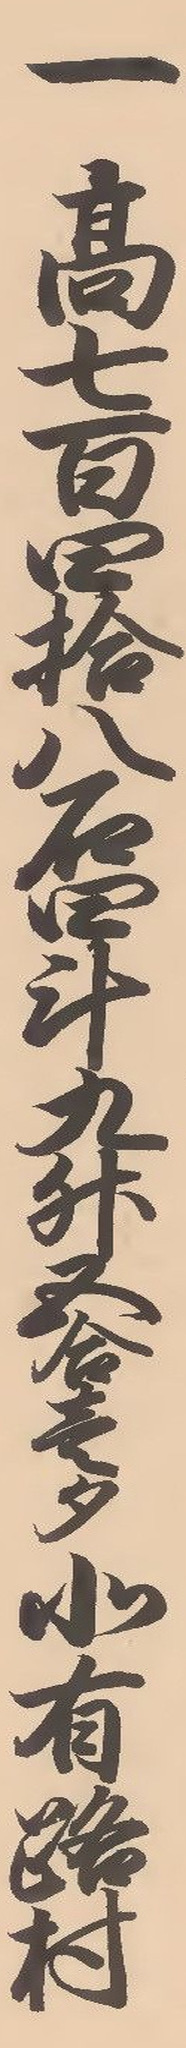一高七百四拾八石四斗九升五合壱勺北有路村
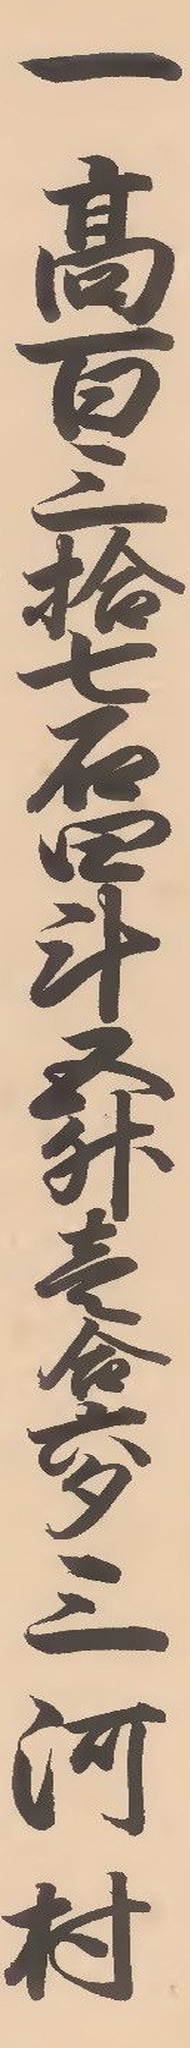一高百三拾七石四斗五升壱合六勺三河村
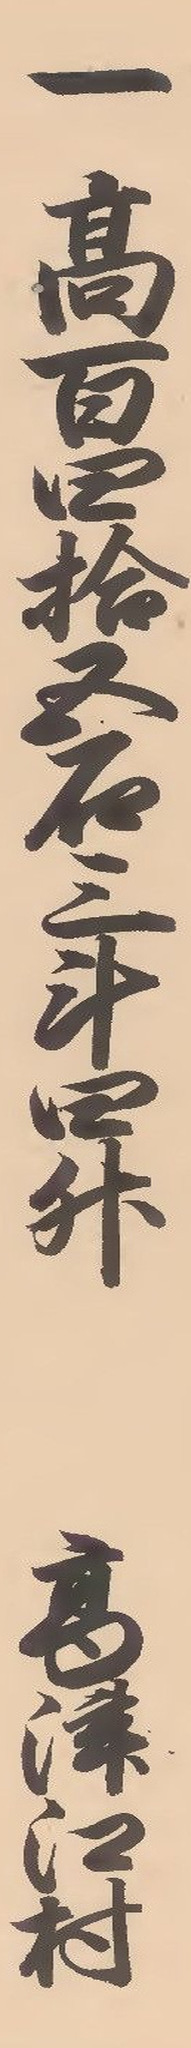一高百四拾五石三斗四升高津江村

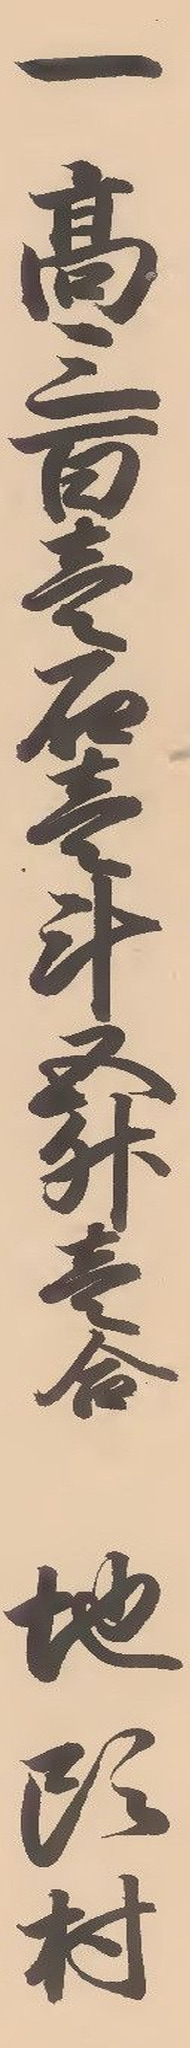一高三百壱石壱斗五升壱合地頭村
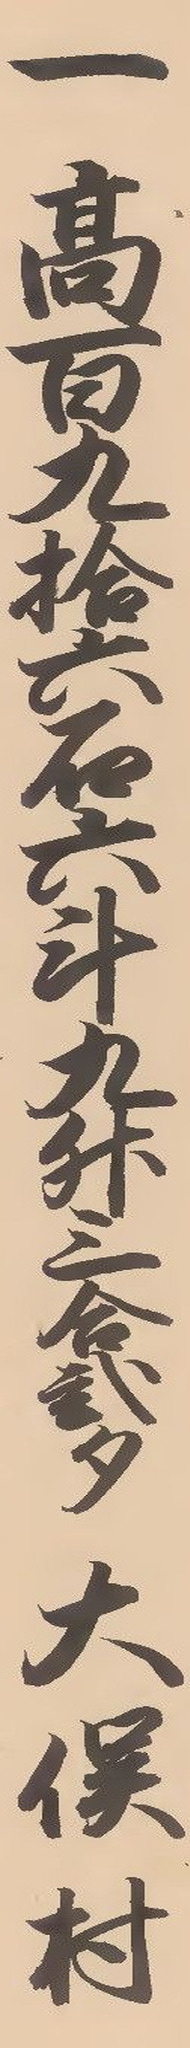一高百九拾六石六斗九升三合弐勺大俣村
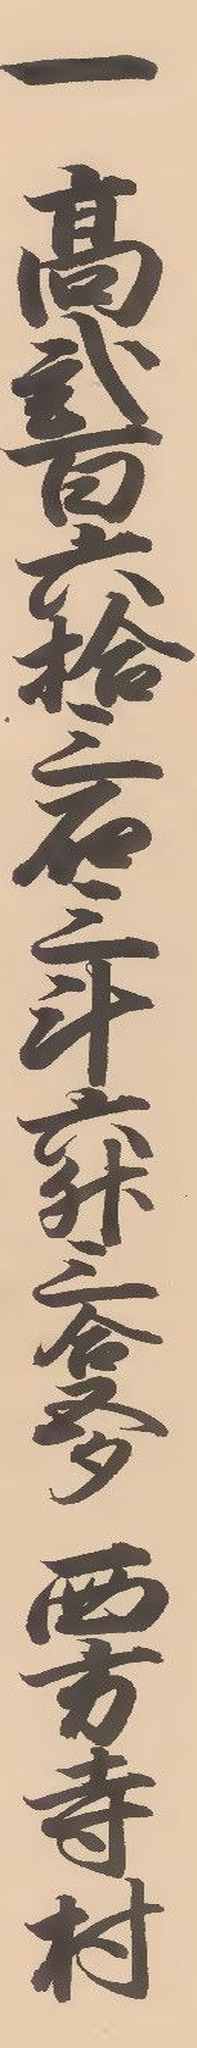一高弐百六拾三石三斗六升三合五勺西方寺村
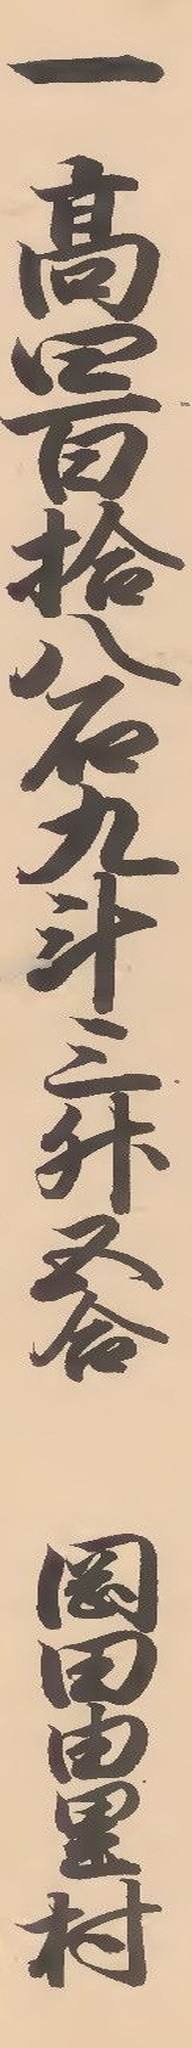一高四百拾八石九斗三升五合岡田由里村
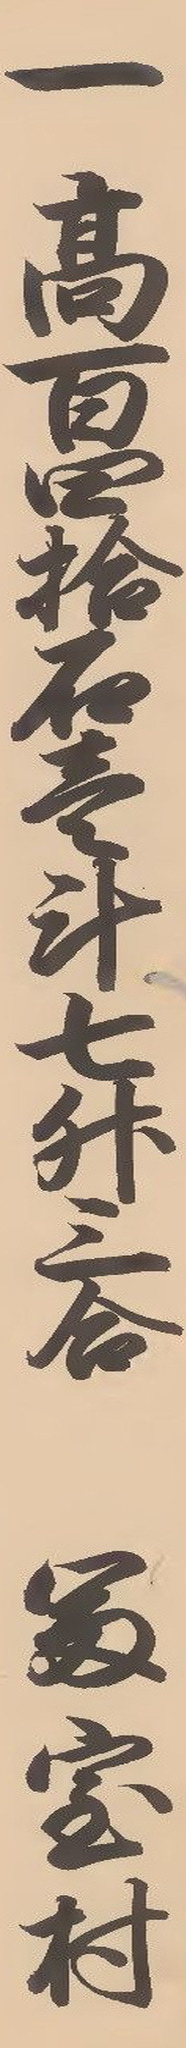一高百四拾石壱斗七升三合冨室村
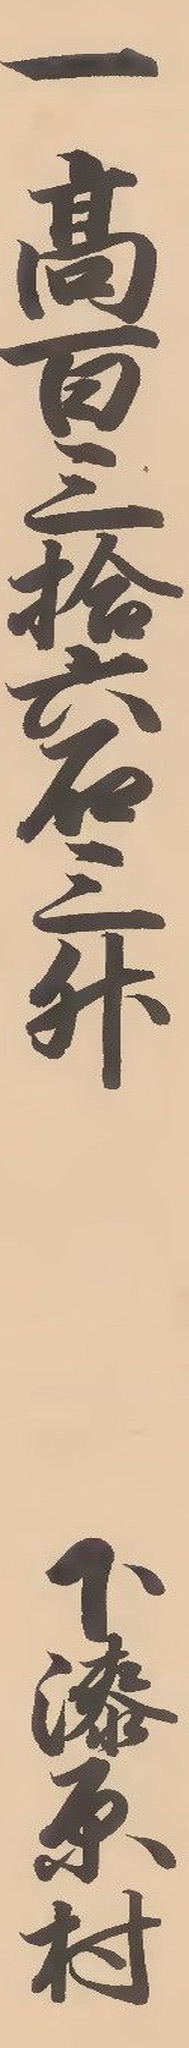一高百三拾六石三升下漆原村
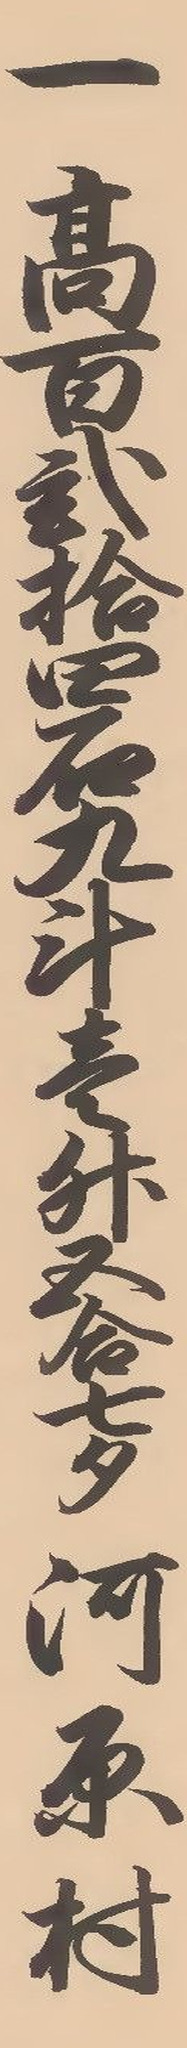一高百弐拾四石九斗壱升五合七勺河原村
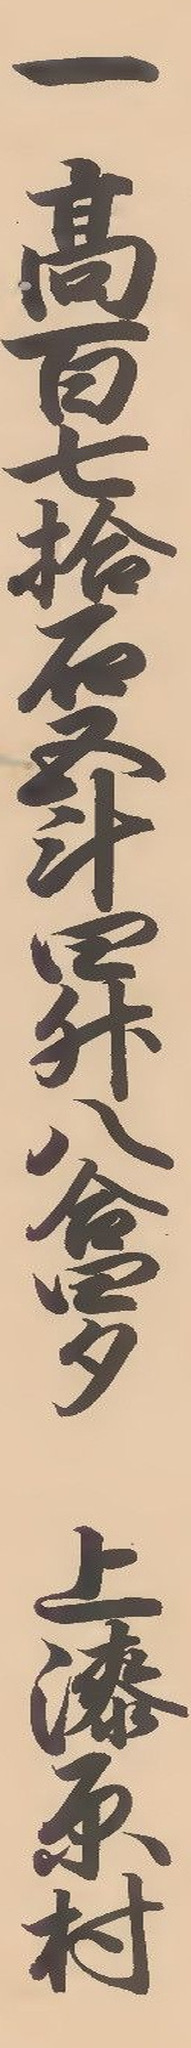一高百七拾石五斗四升八合四勺上漆原村

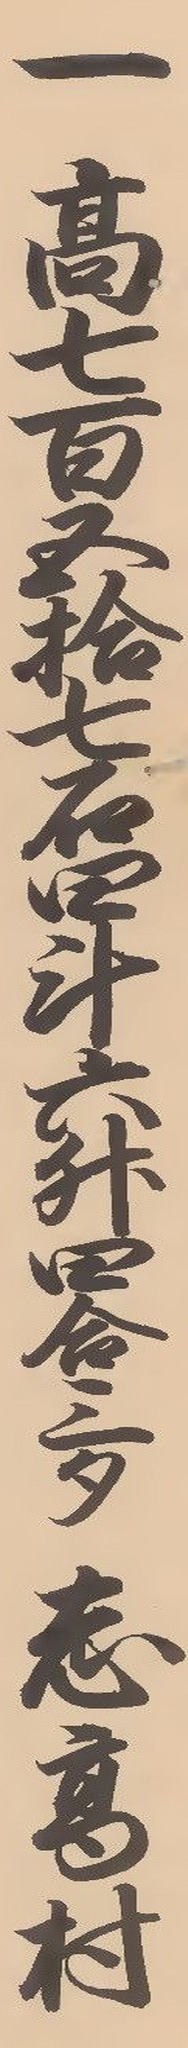一高七百五拾七石四斗六升四合三勺志高村
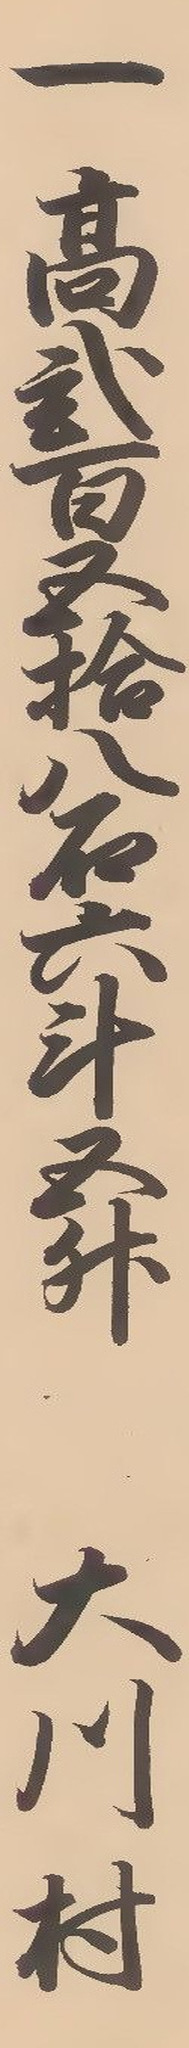一高弐百五拾八石六斗五升大川村
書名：丹後国郷帳
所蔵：国立公文書館 National Archives of Japan
